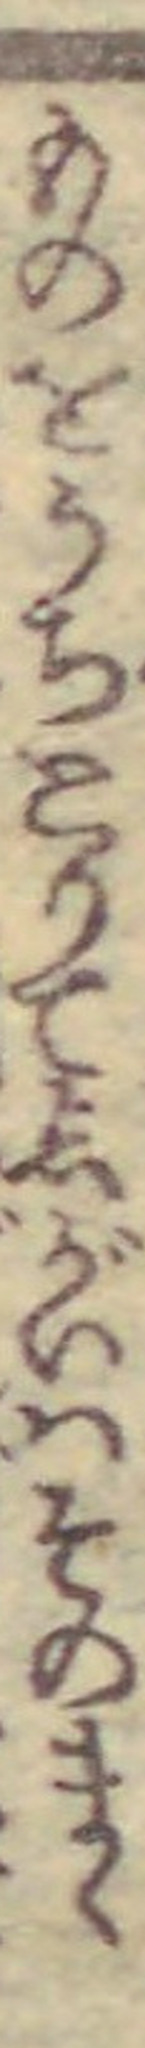ものをうちとりてしがいはそのまゝ
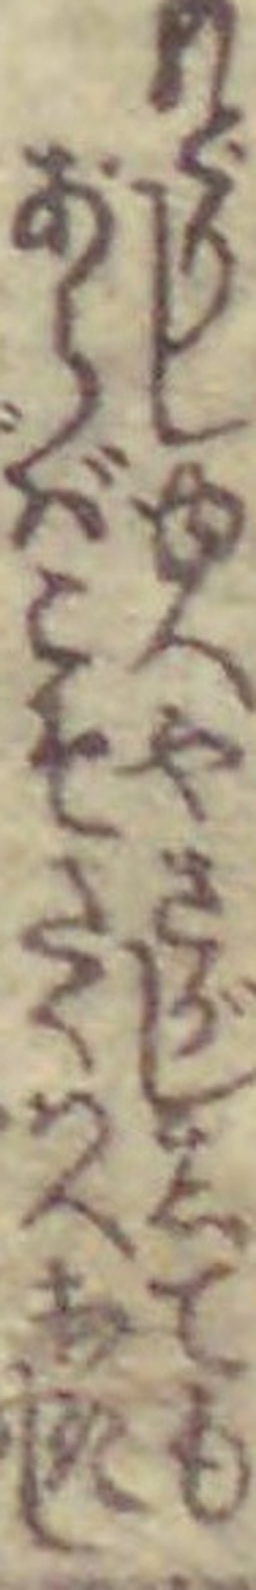あらばこそたくはへおきし
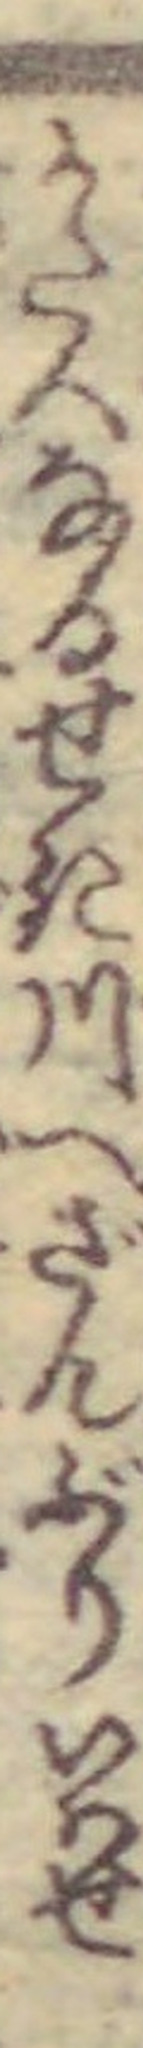かたへなるせき川へざんぶりいはせ
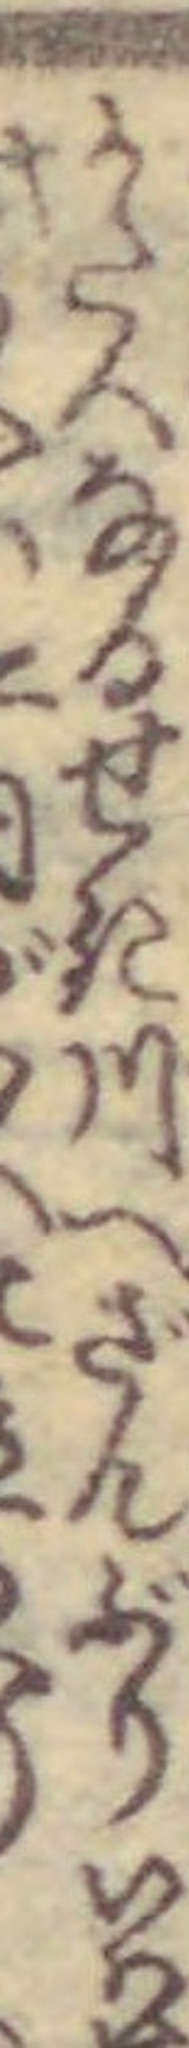かたへなるせき川へざんぶりいはせ
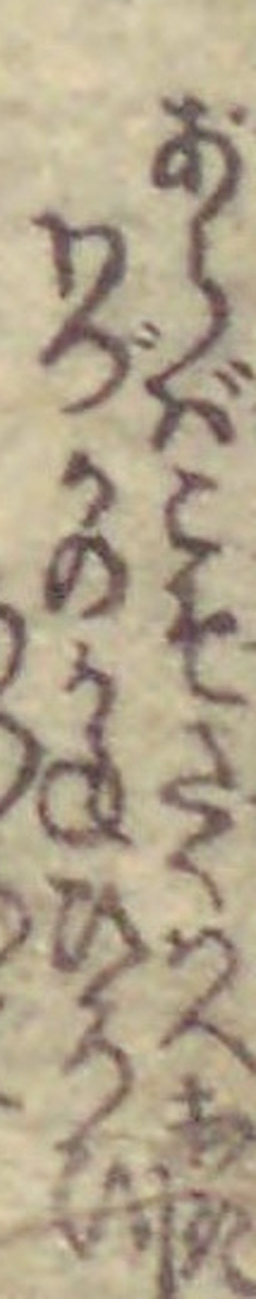わづかのかねひろひ
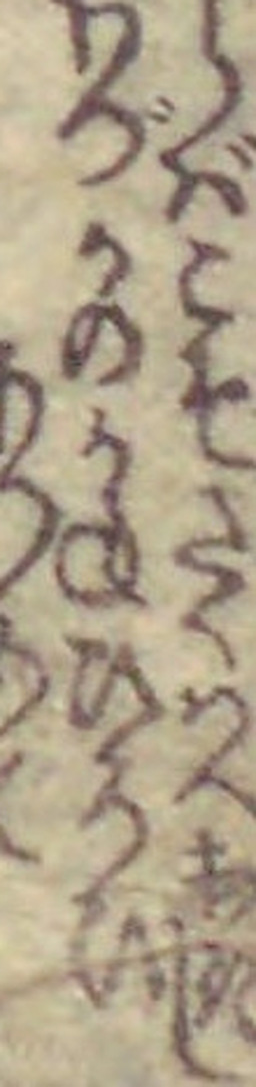わづかのかねひろひ
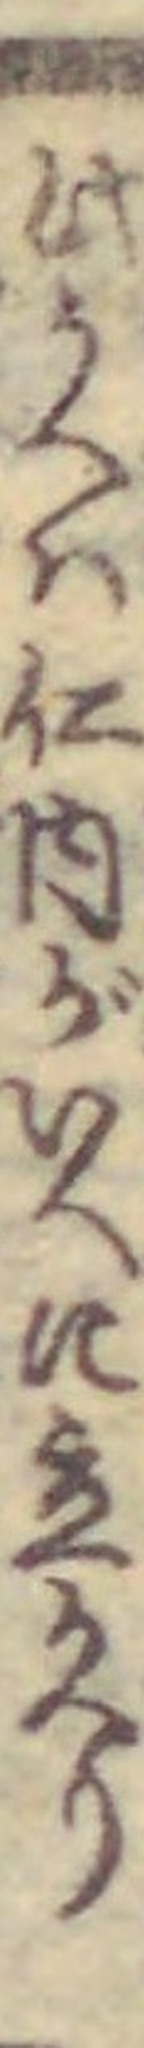此うへは仁内がいへに立かへり
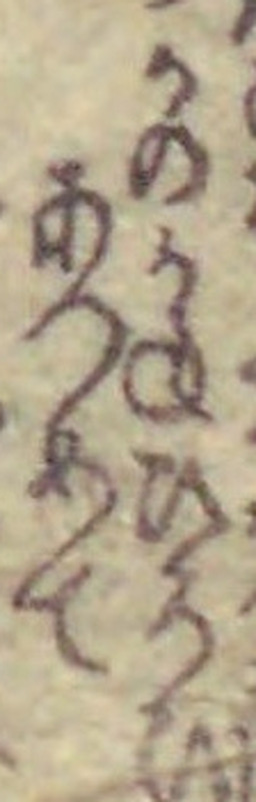あつめて
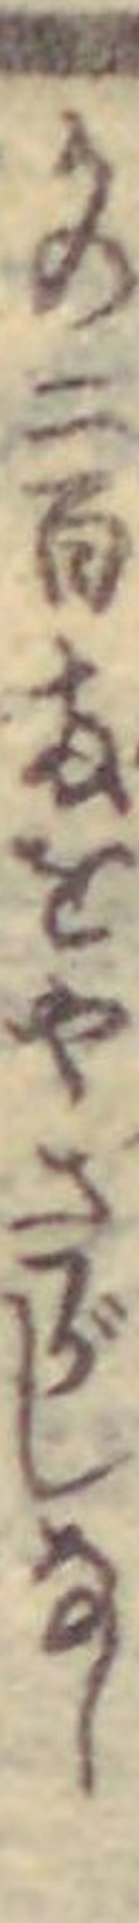かの二百両をやさがしなし
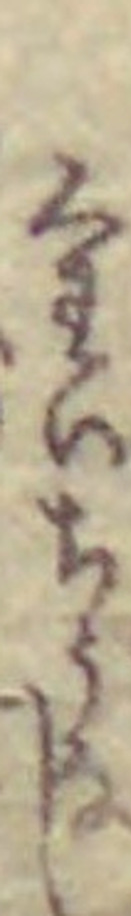くわいちうなし
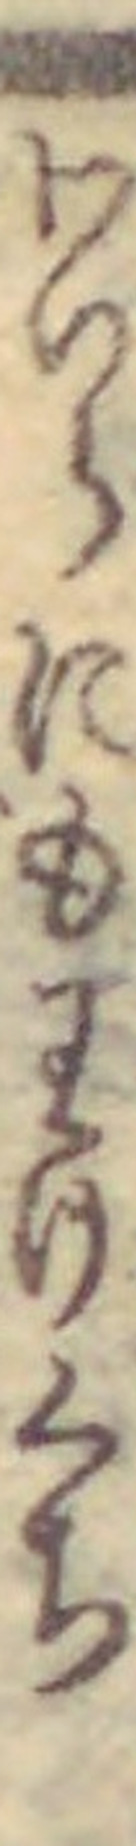わいらにもわけくち
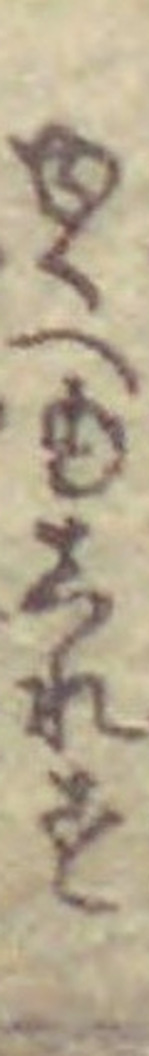ゆくへもしれす
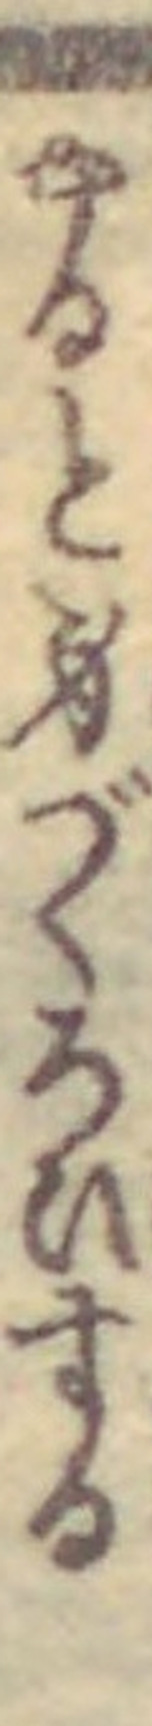やると身づくろひする
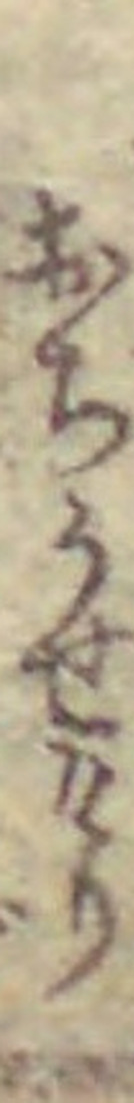おちうせけり
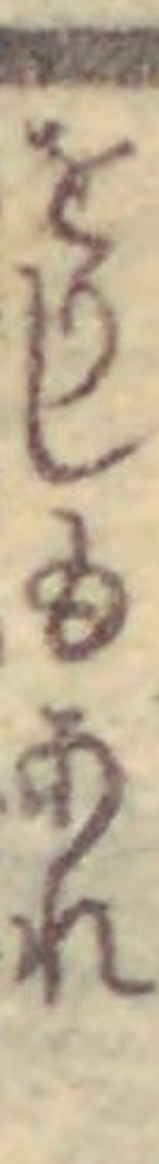をりしもあれ
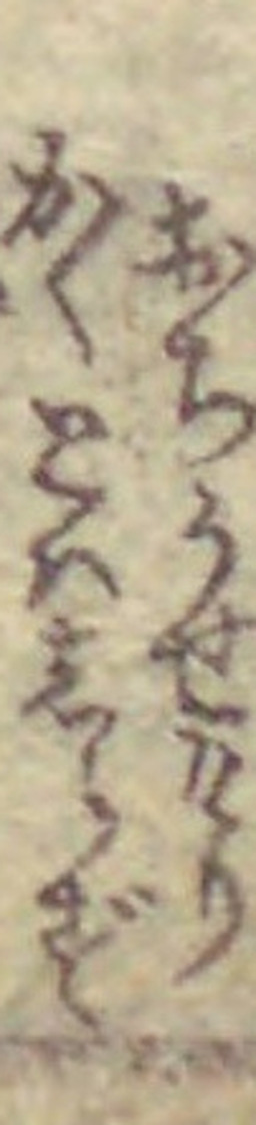かくとはしらず
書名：八ツ目鱣因縁物語 3巻
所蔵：国立国会図書館 National Diet Library, JAPAN
